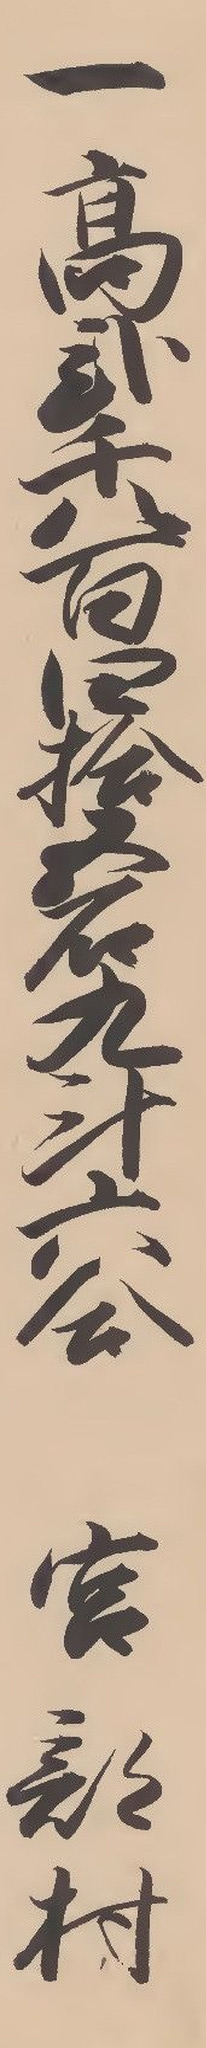一高弐千八百四拾五石九斗六合宮部村
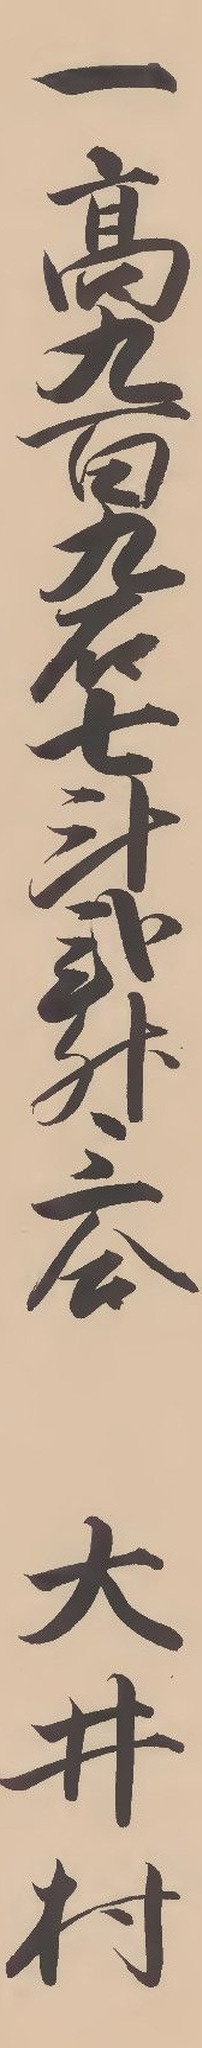一高九百九石七斗弐升三合大井村
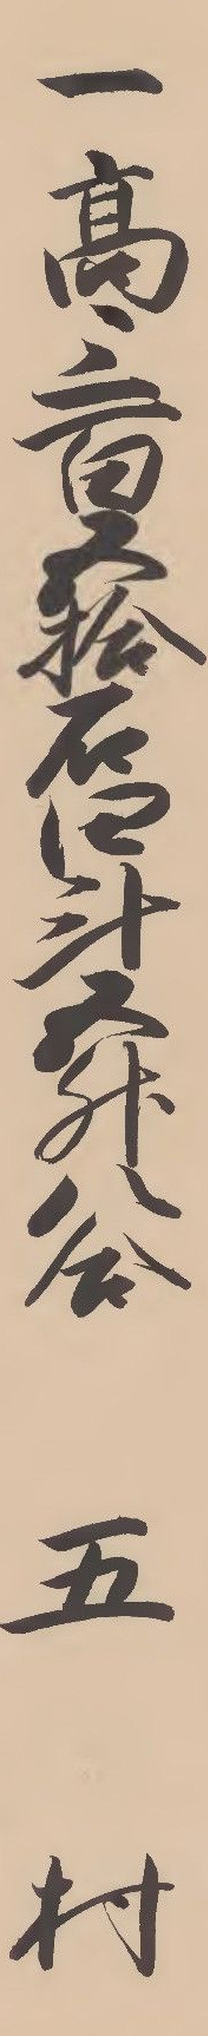一高三百五拾石四斗五升八合五村
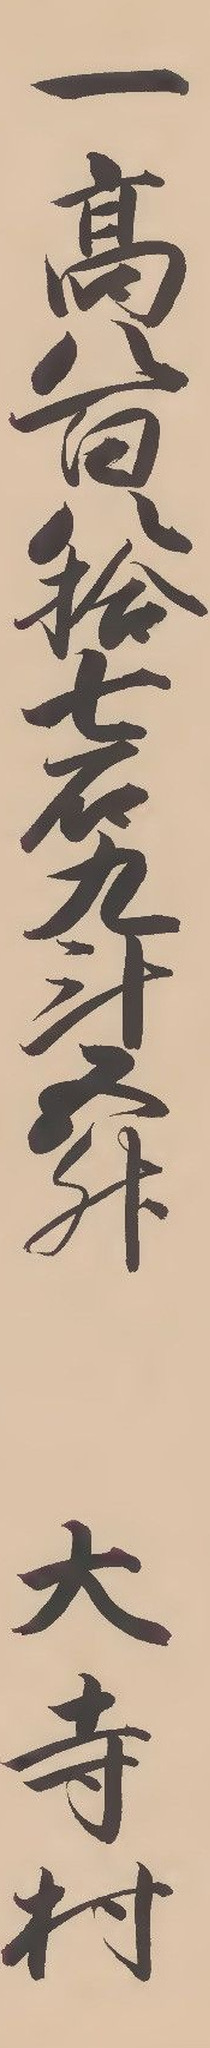一高八百八拾七石九斗五升大寺村
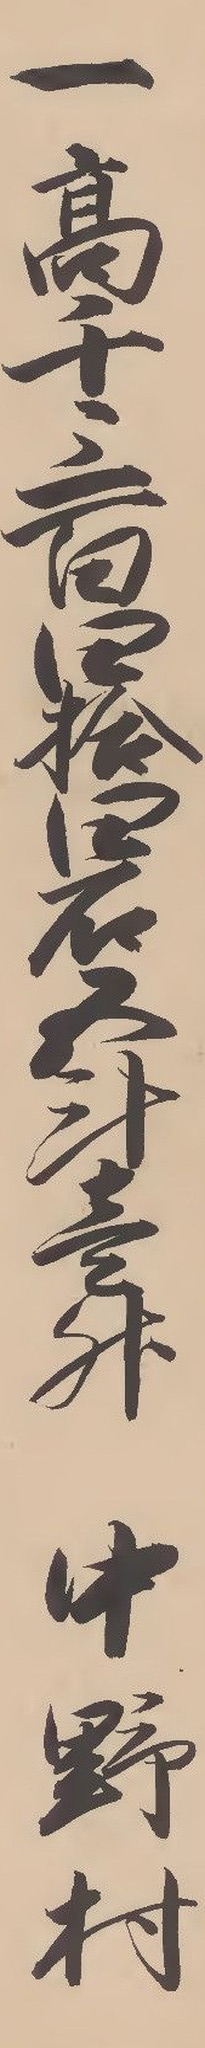一高千三百四拾四石五斗壱升中野村
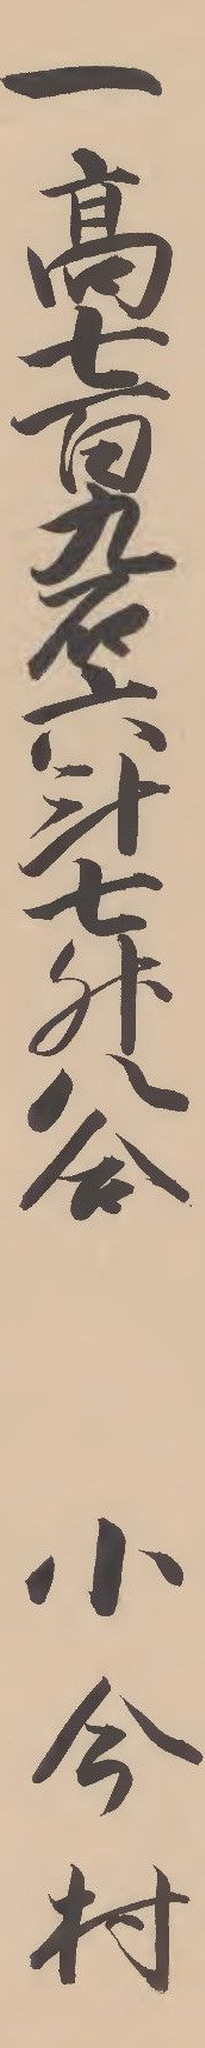一高七百九石六斗七升八合小今村
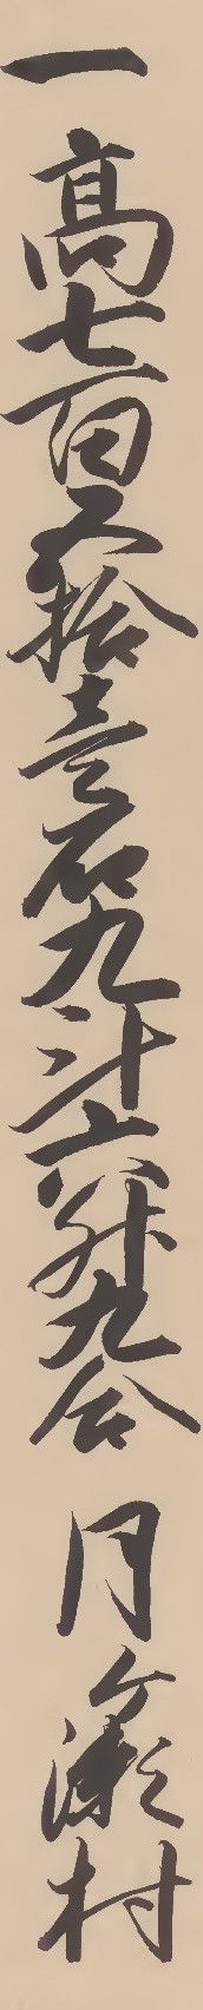一高七百五拾壱石九斗六升九合月ヶ瀬村
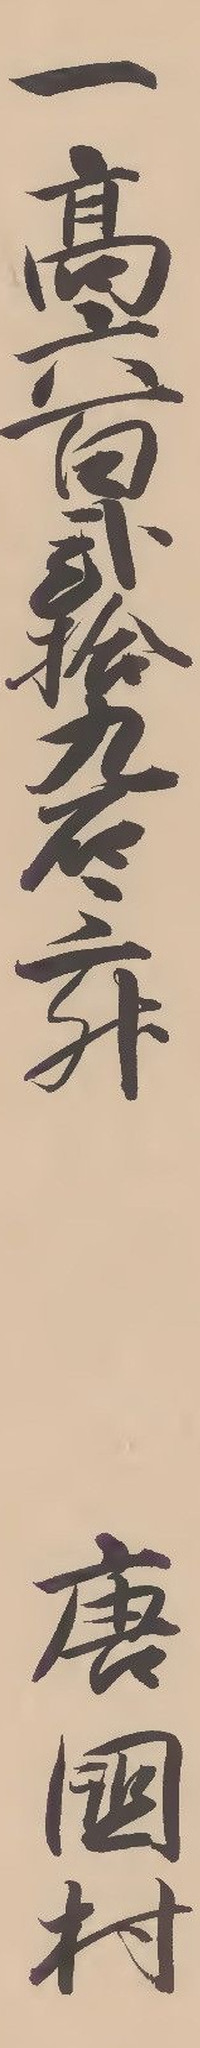一高六百弐拾九石三升唐国村

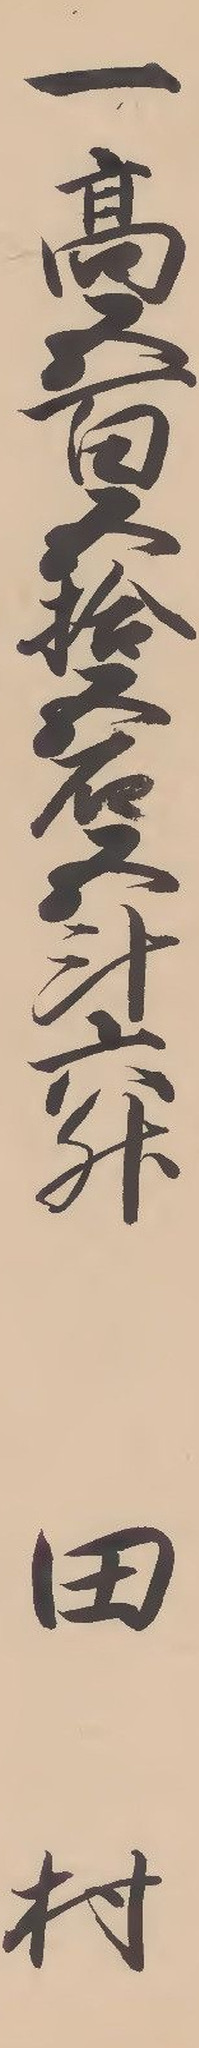一高五百五拾五石五斗六升田村
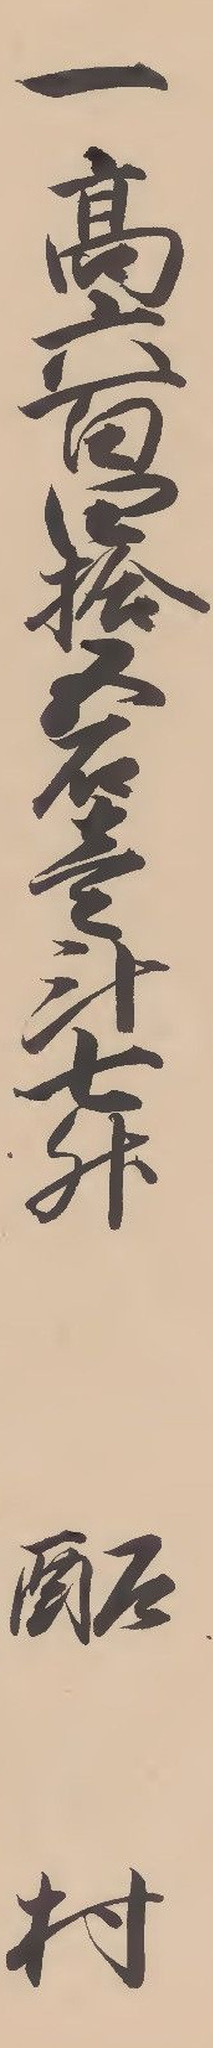一高六百四拾五石壱斗七升酢村
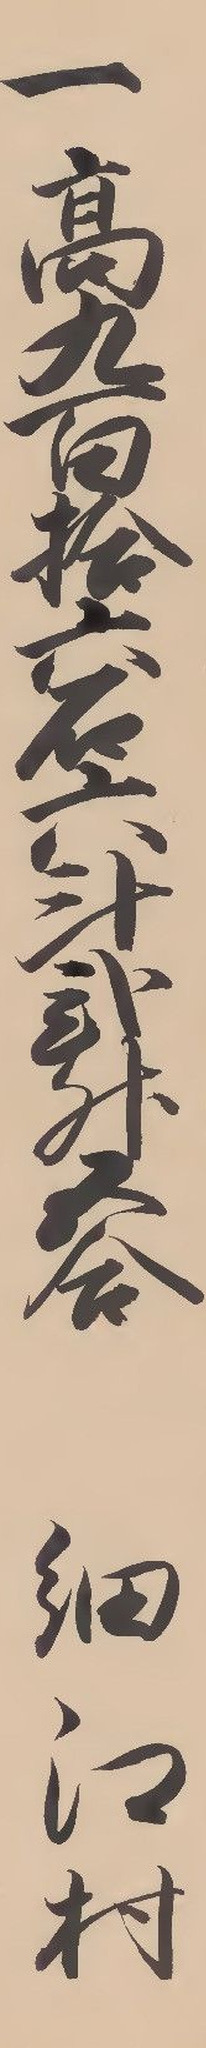一高九百拾六石六斗弐升五合細江村
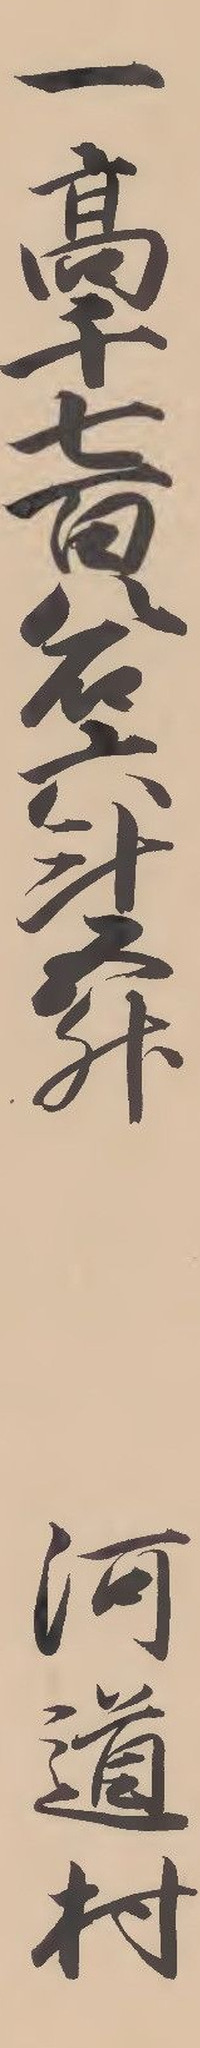一高千七百八石六斗五升河道村
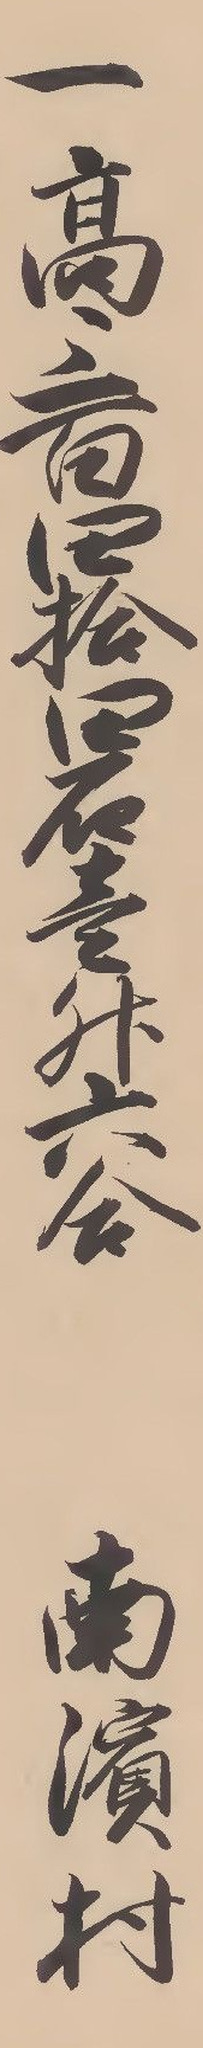一高三百四拾四石壱升六合南浜村
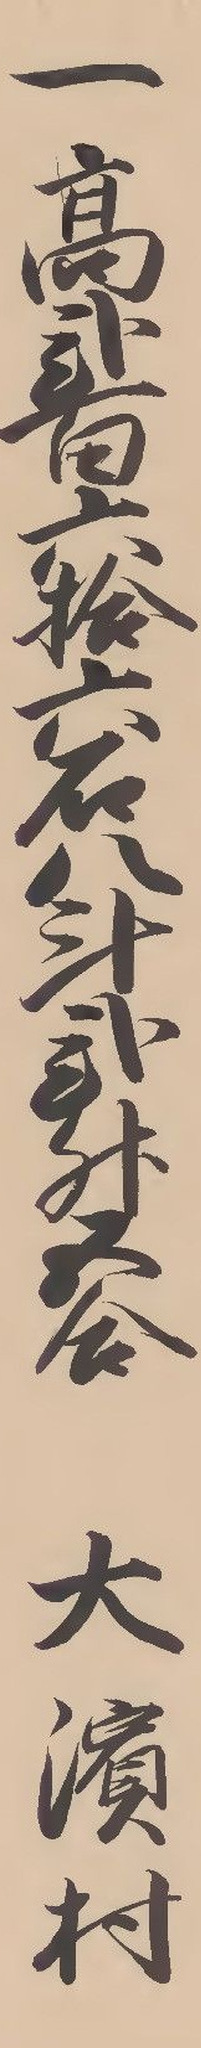一高弐百六拾六右八斗弐升五合大浜村

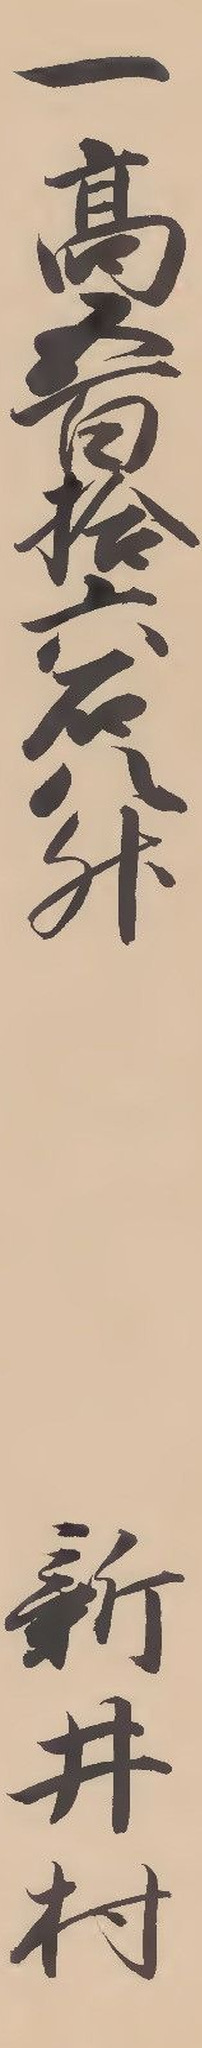一高五百拾六石八升新井村
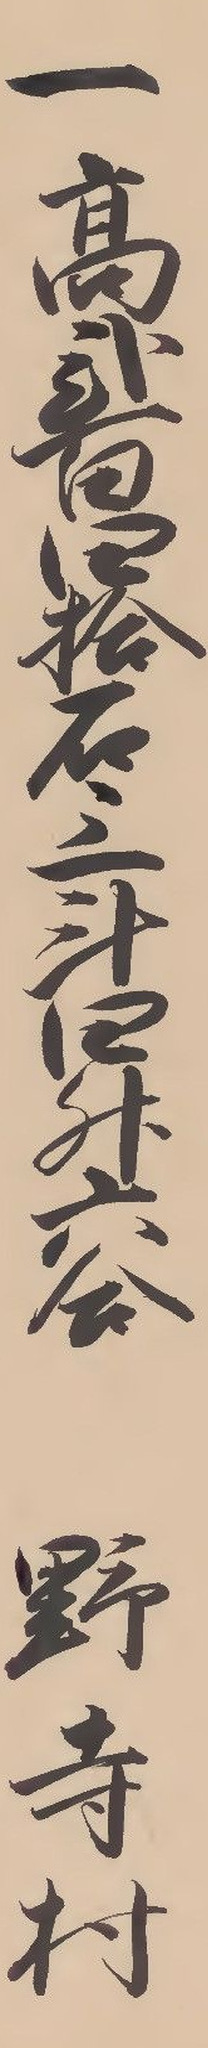一高弐百四拾石三斗四升六合野寺村
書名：近江国郷帳
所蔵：国立公文書館 National Archives of Japan
